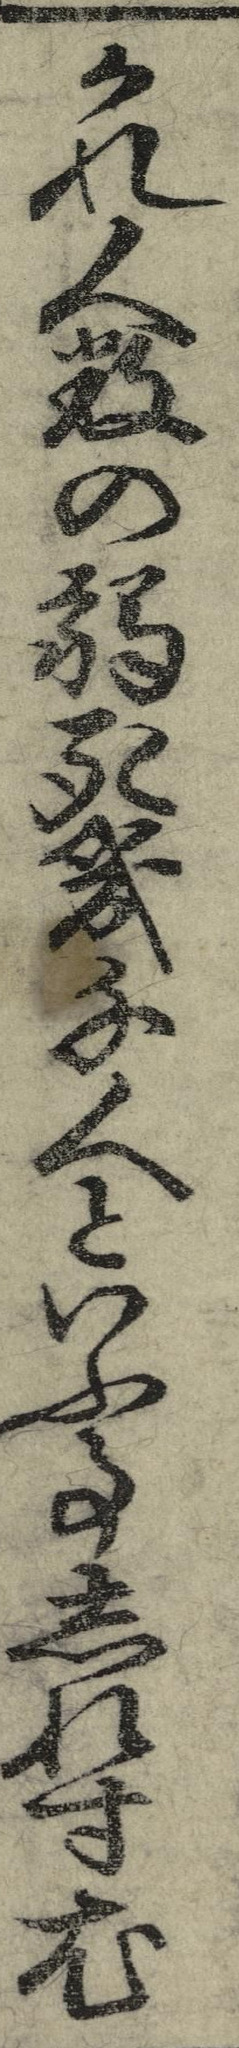かれ人数の弱死幾千人といふ事しれず尤
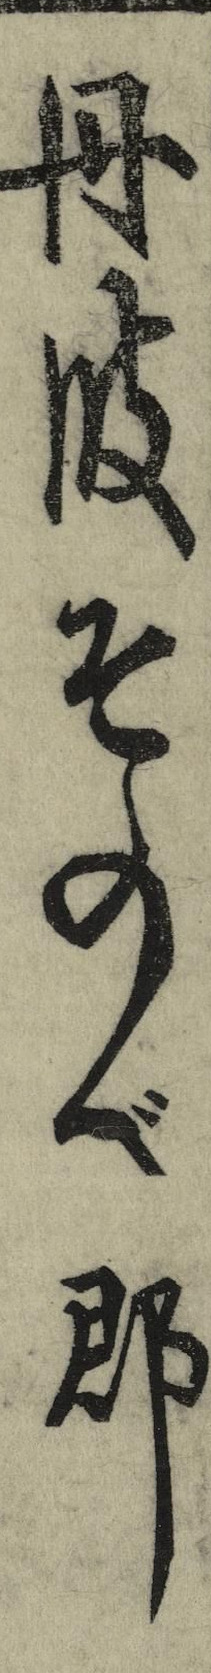丹波そのべ郡
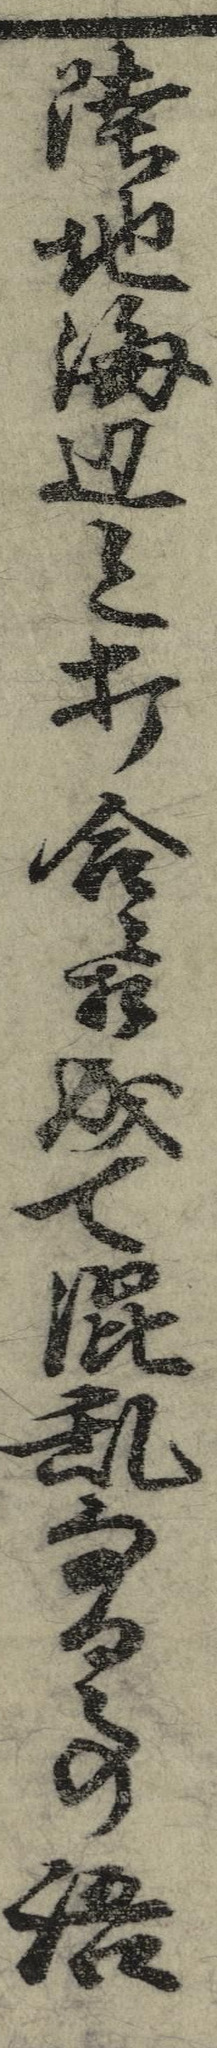陸地海辺を打合ニ相成て混乱なる事語
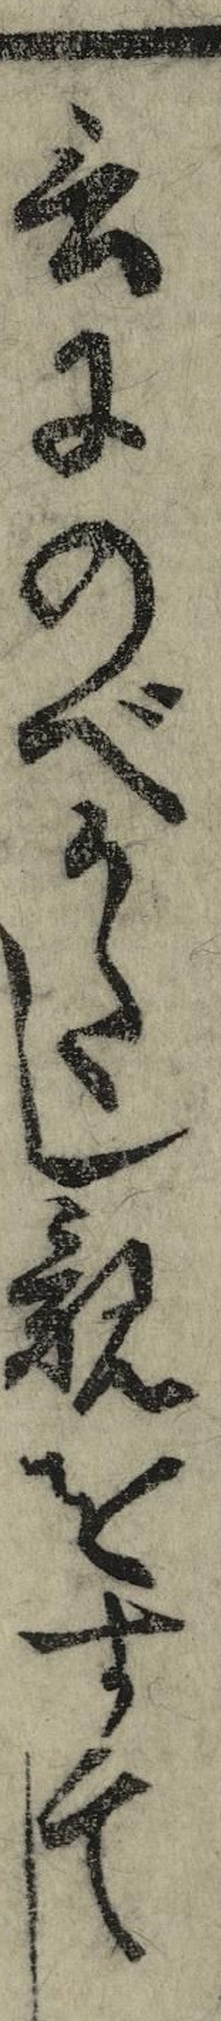言にのべかたし親をすて
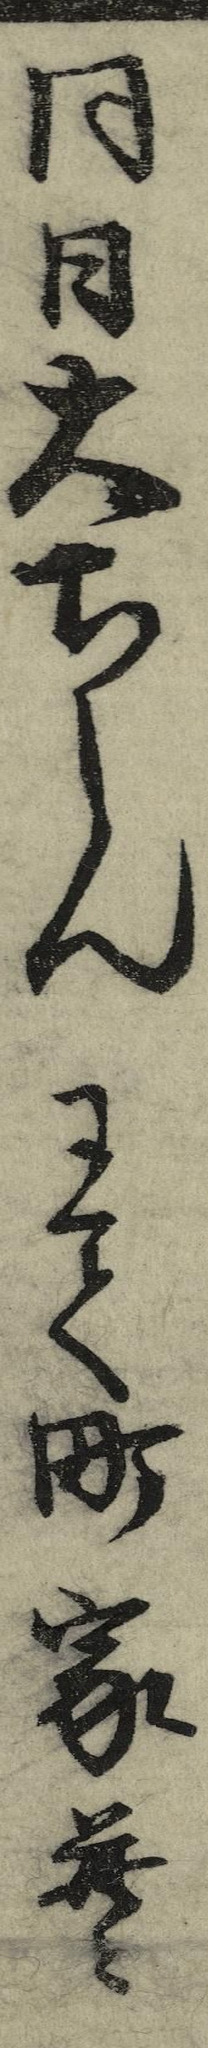同日大ちしんにて町家并ニ
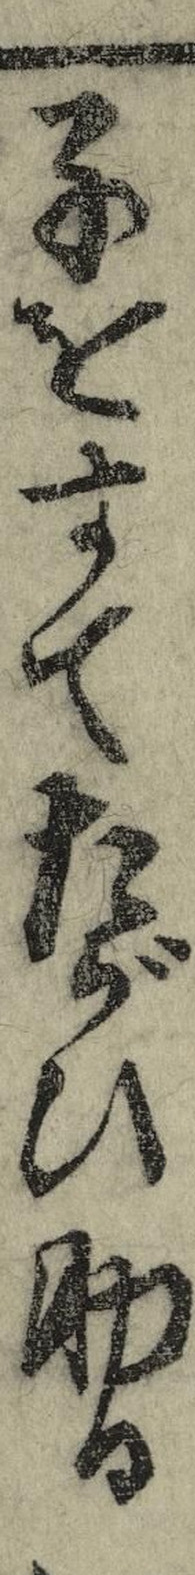子をすてたがひ助る
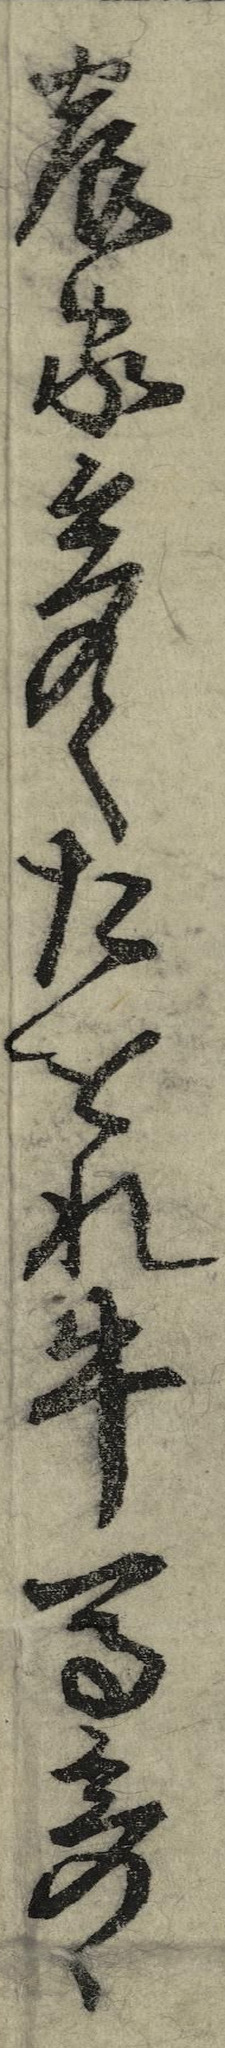農家多くたをれ牛馬多く
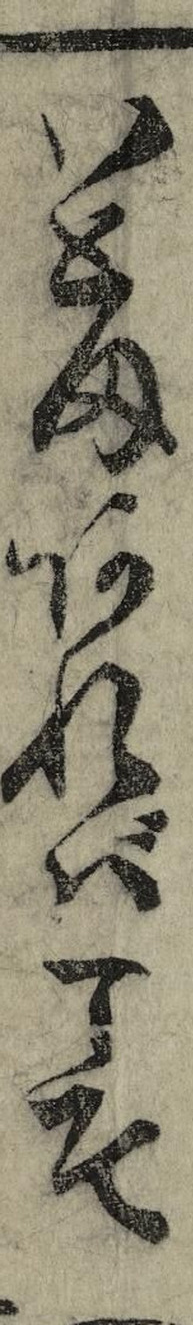いとまあれバこそ
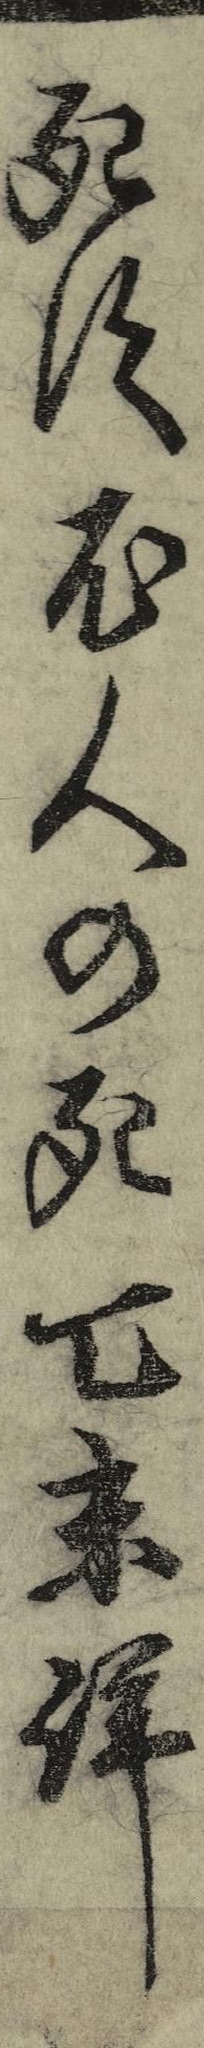死す尤人の死亡未詳
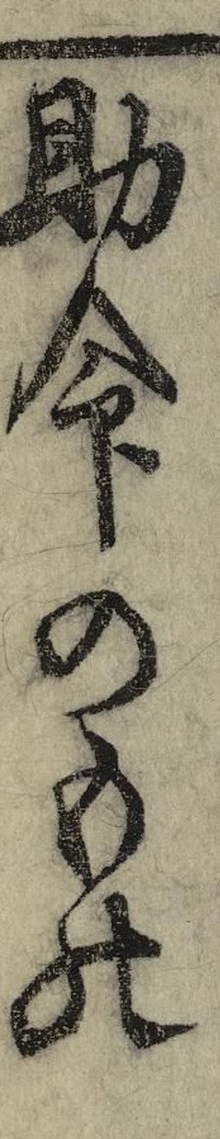助命のもの
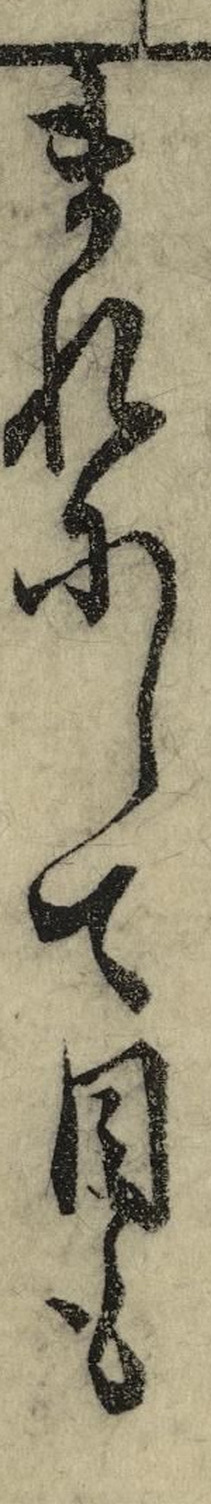まれにして目も
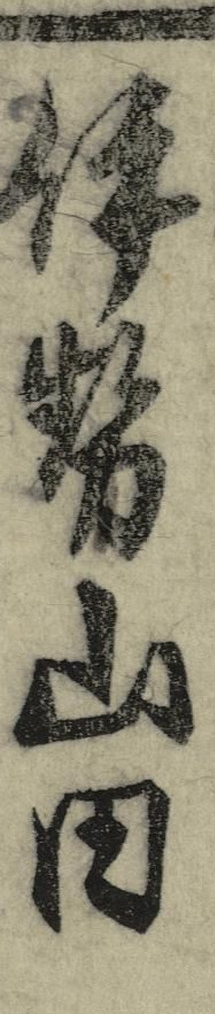伊勢山田
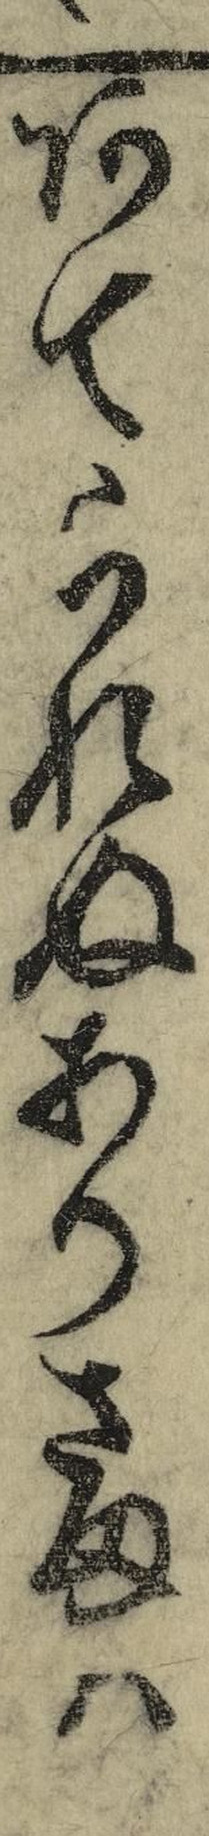あてられぬありさまハ
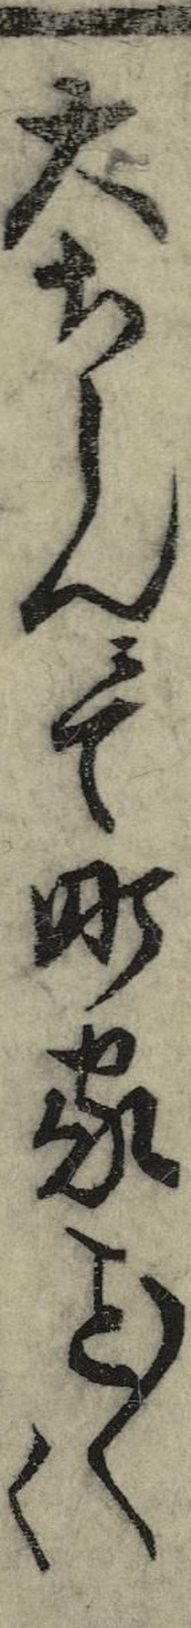大ちしんニて町家こと〴〵く
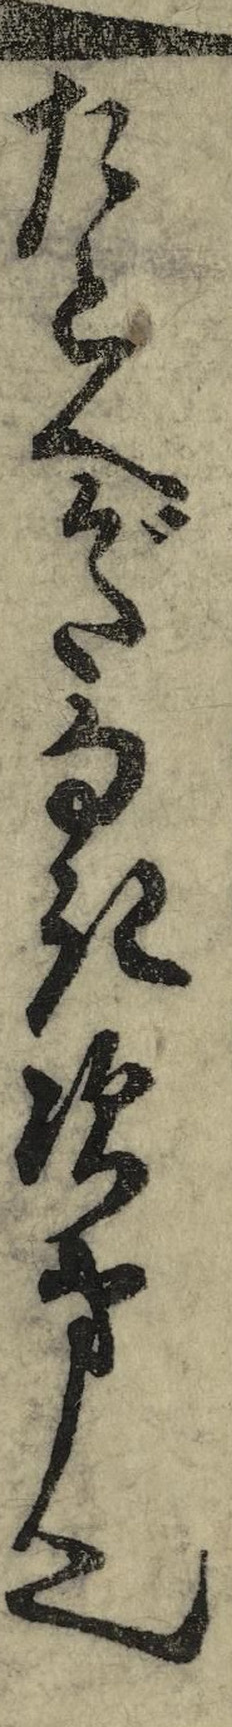たとへかだるき次第也
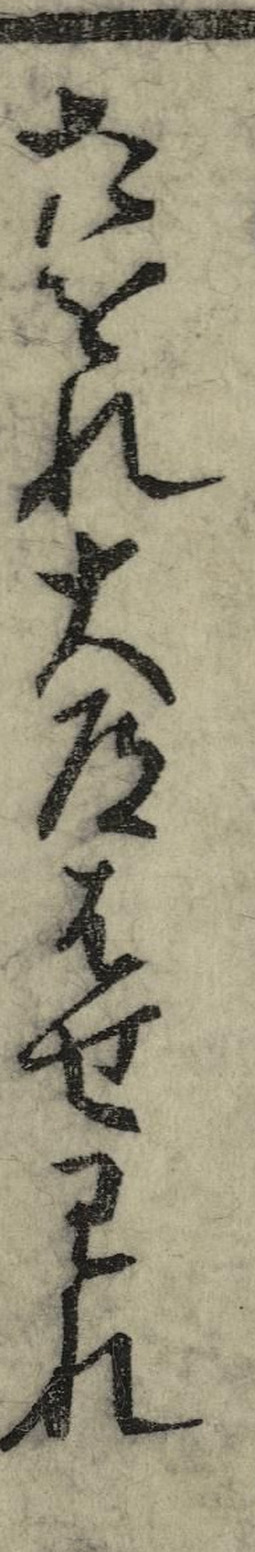たをれ大道はせわれ
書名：諸國大地震つなみ混乱記　嘉永七寅十一月四日五日両日之次第三編
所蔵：東京大学地震研究所図書室 Earthquake Research Institute Library, The University of Tokyo, JAPAN
